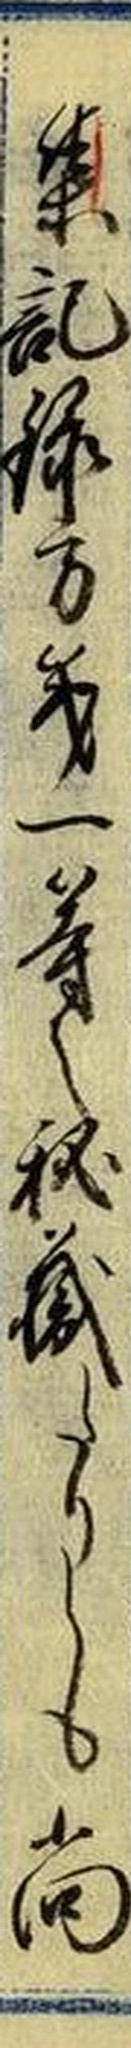集記録方第一等之秘蔵たりしも尚
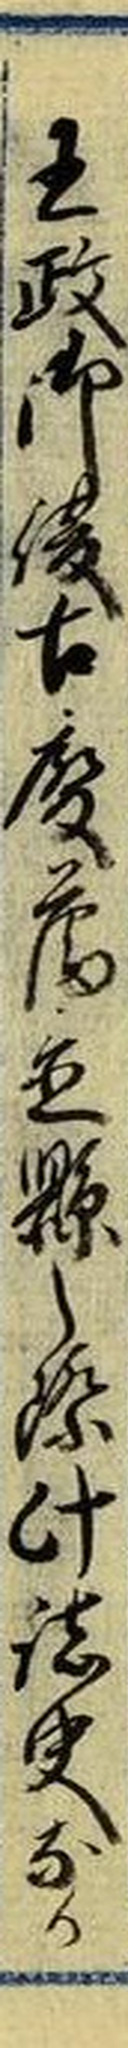王政御復古廃藩置県之際此諸史なか
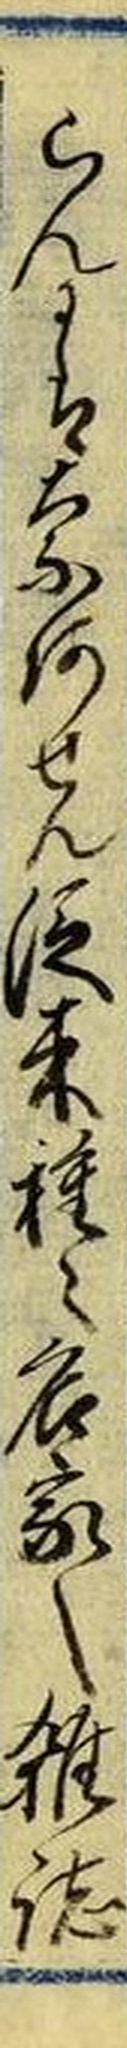らんには奈何せん従来種々之名家之雑誌
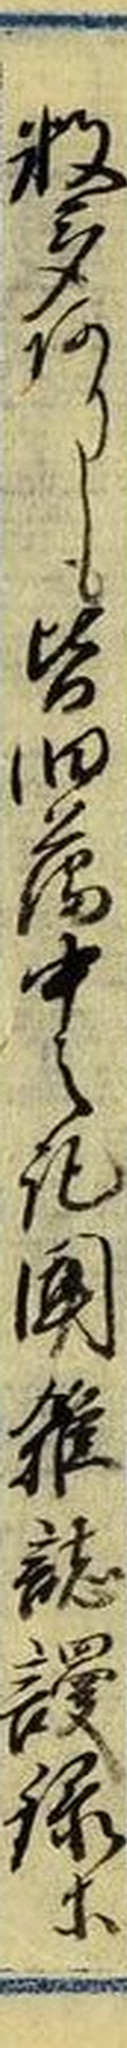数多ありしも皆旧藩中之記聞雑誌謾録等
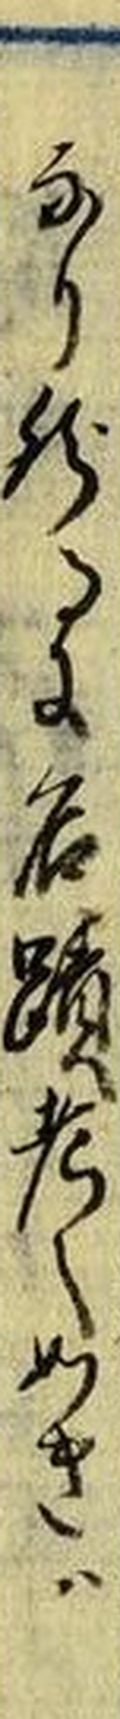なり然るに名蹟考之如きは
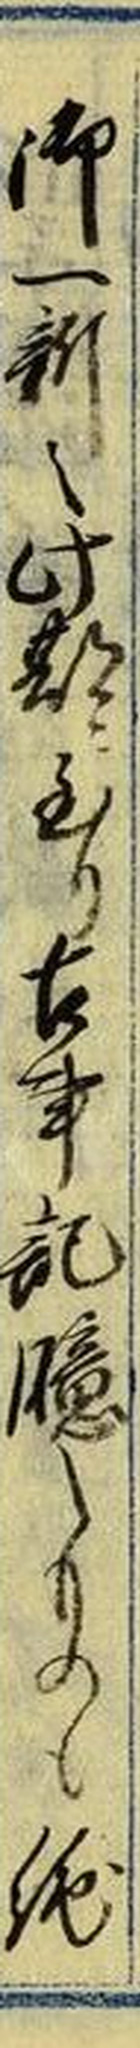御一新之此期に至り古事記臆之ものも絶
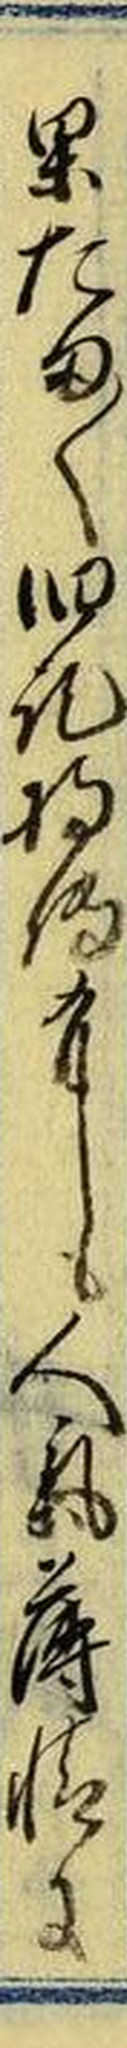果たま〳〵旧記持伝有しも人気薄情に
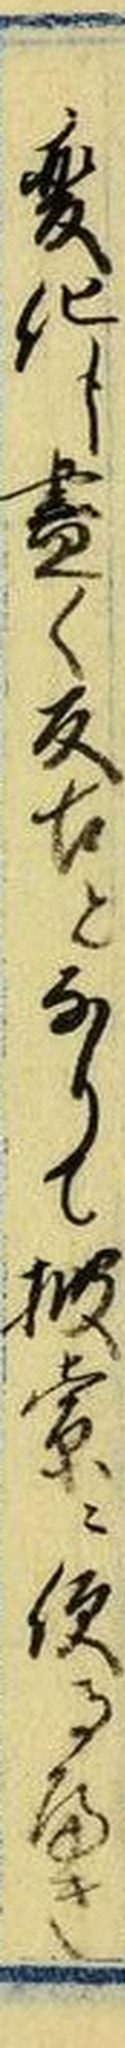変化し尽く反古となりて披索に便るへき
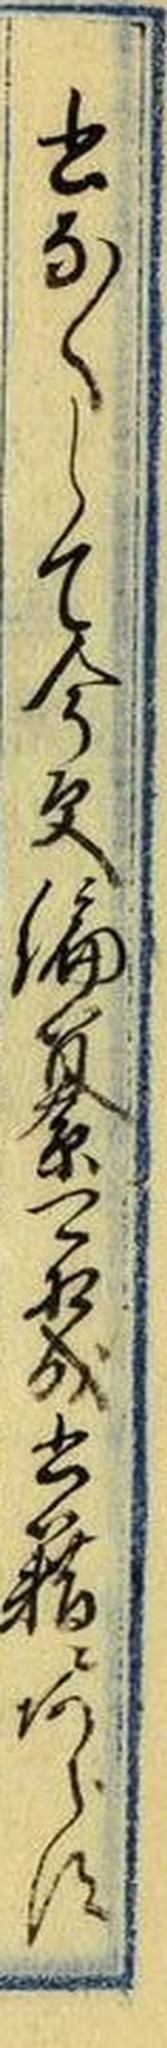書なくして今更編纂可相成書籍にあらす
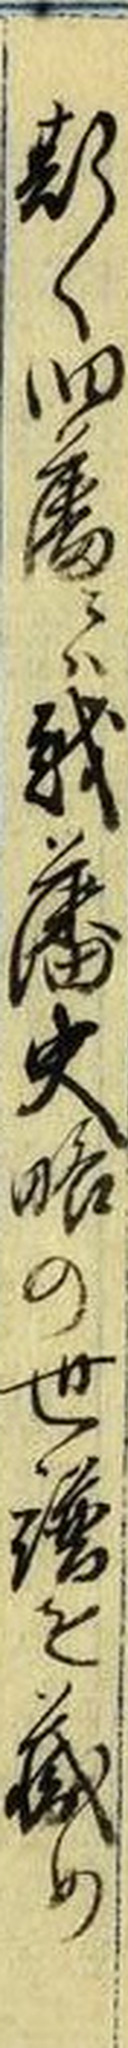斯く旧藩には越藩史略の世譜を蔵め
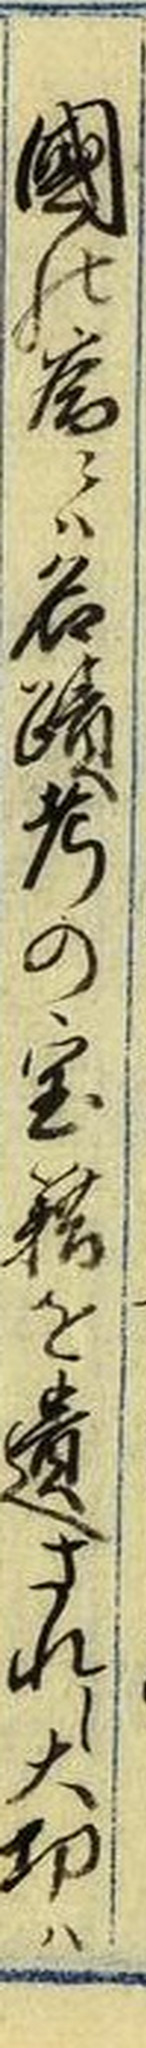国の為には名蹟考の宝籍を遺されし大功は
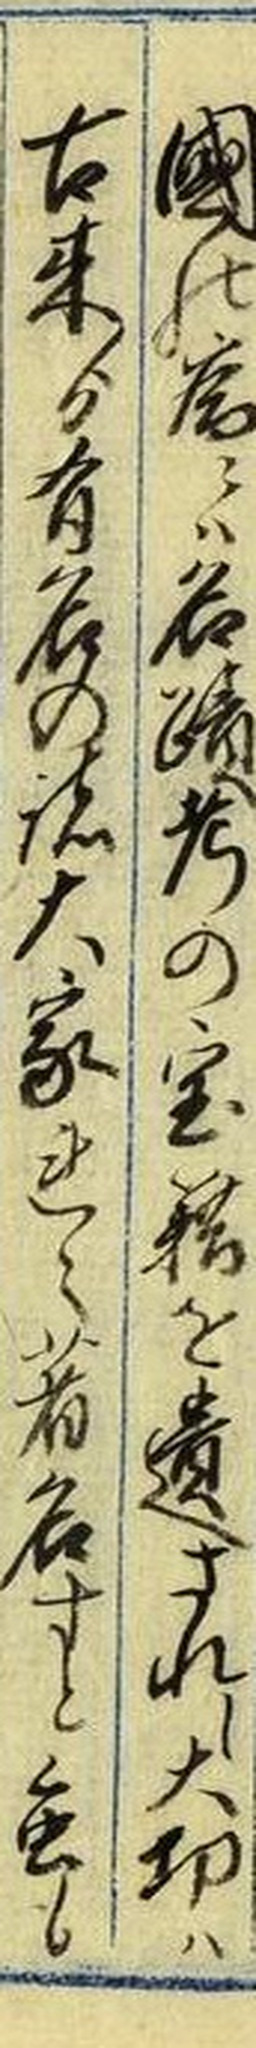古来ゟ有名の諸大家連之著名すと雖も
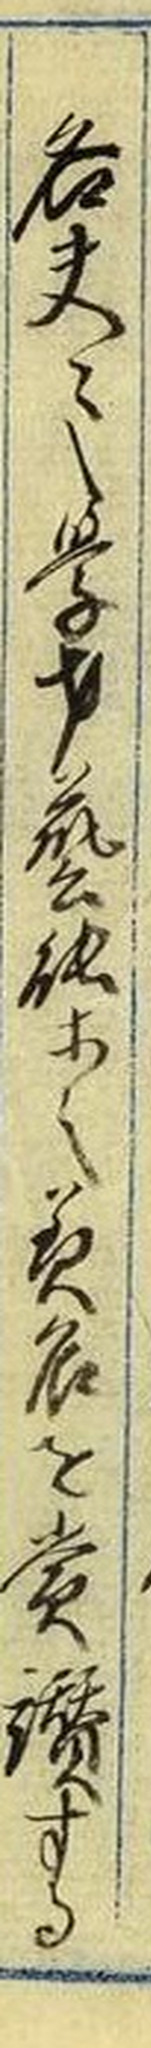各夫々之学才芸能等之美名を賞賛する
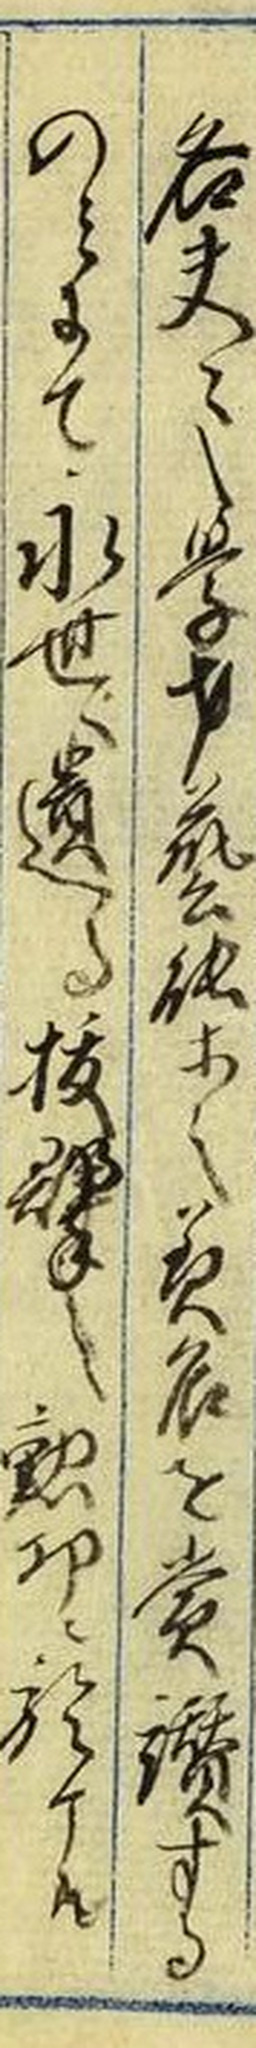のみにて永世へ遺る抜羣之勲功に於ける
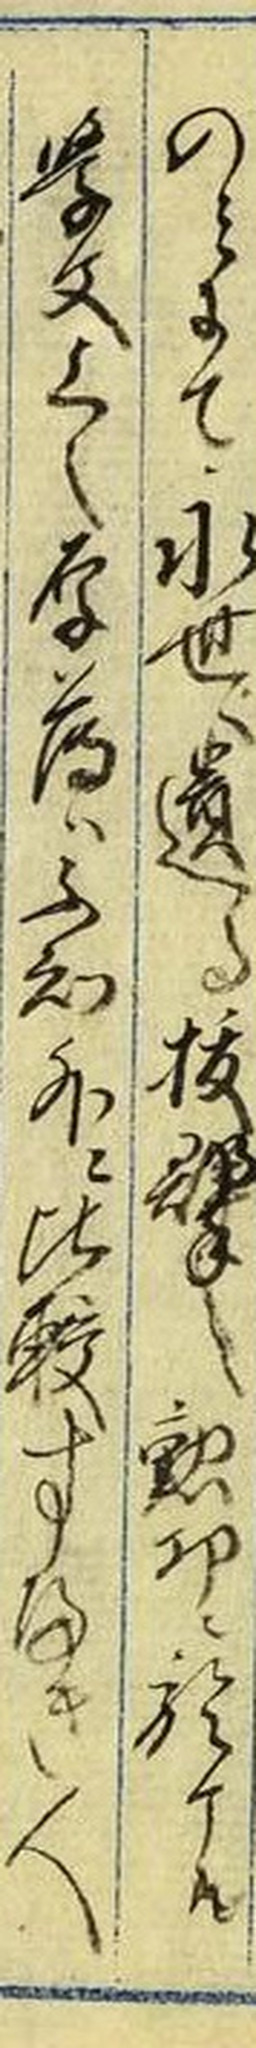学文上之厚薄は不知外に比較すへき人
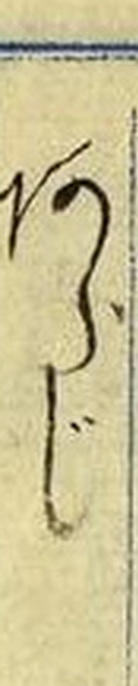あらじ
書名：温古集 四巻
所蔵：福井県文書館 Fukui Prefectural Archives
